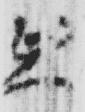也
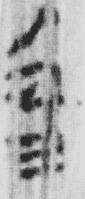昏（聞）
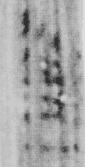道
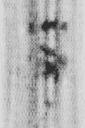反
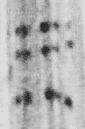己
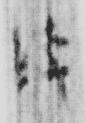攸（修）
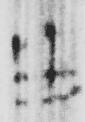身
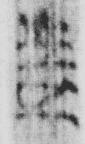者
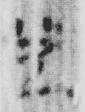也
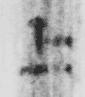上
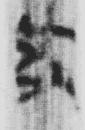交
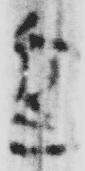近
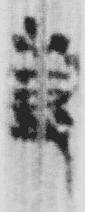事
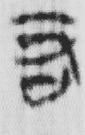君
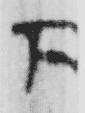下
